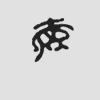害
